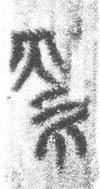縈
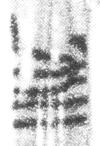爲
